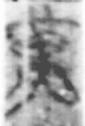黃
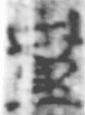皇
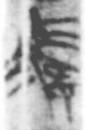馭（御）
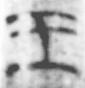王
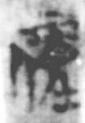僮
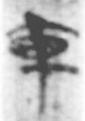車
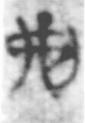刑
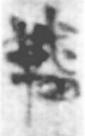轓
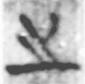之
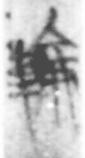輪
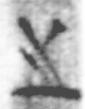之
